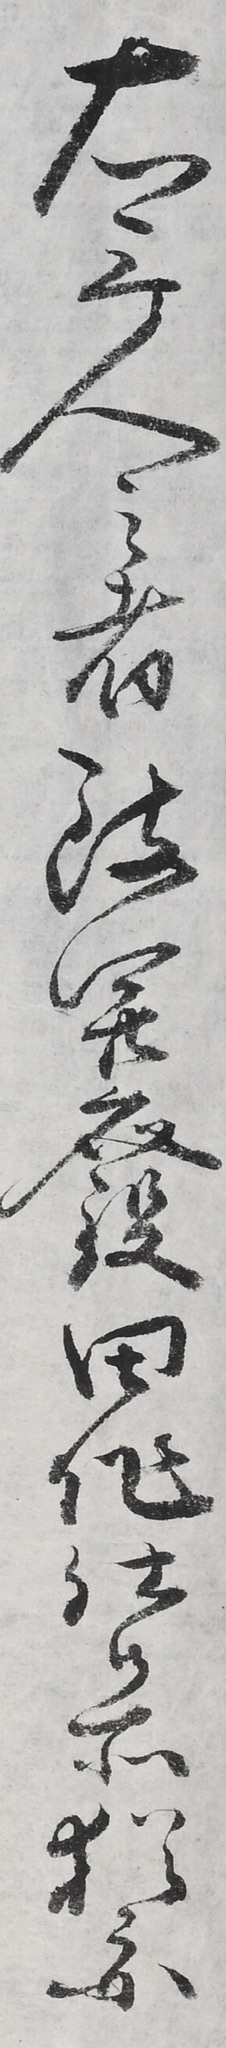右三人之者致開発田作仕候所猶亦
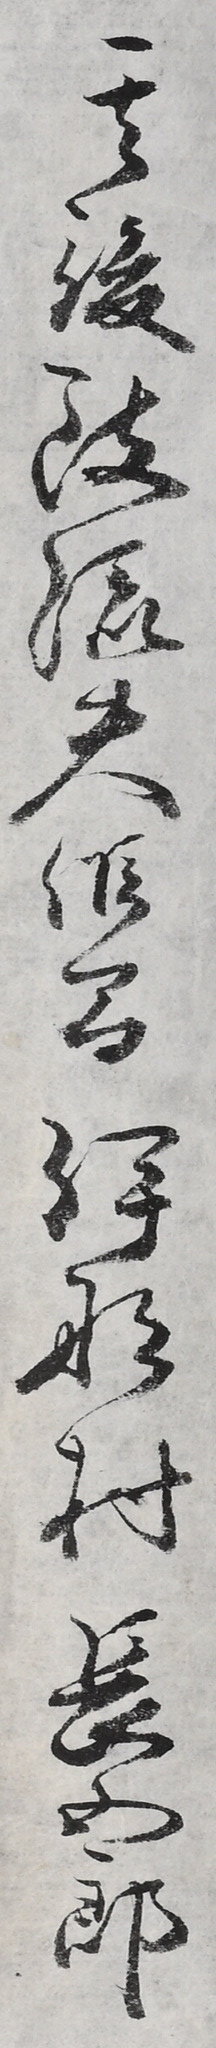其後致流失候間伊那村長五郎
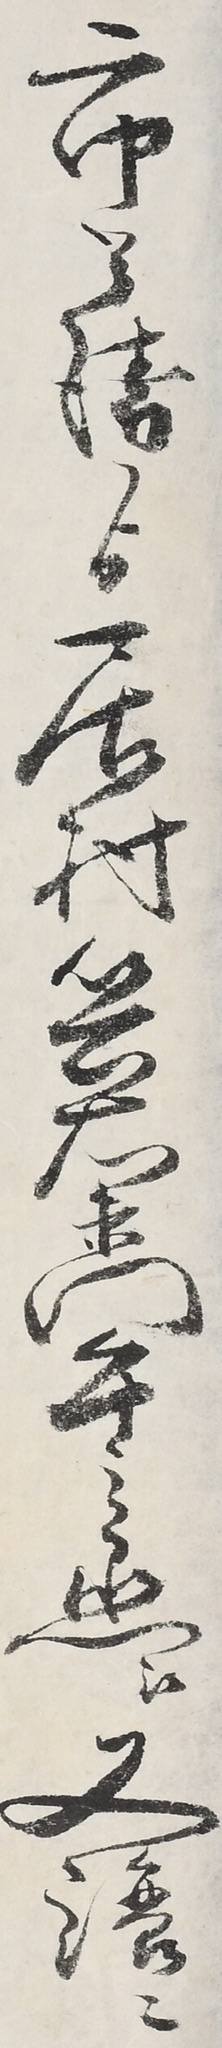市兵衛ゟ居村兵右衛門午之烝江又譲ニ
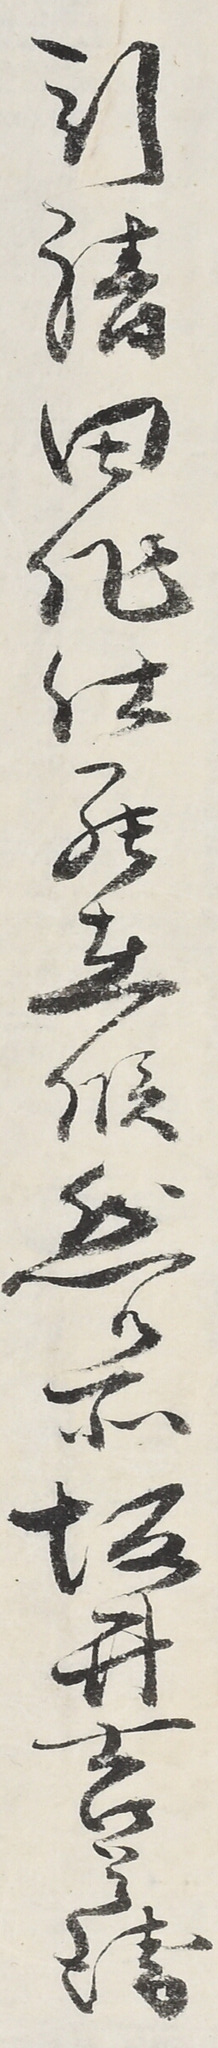引請田作仕罷在候然ル所坂井吉兵衛
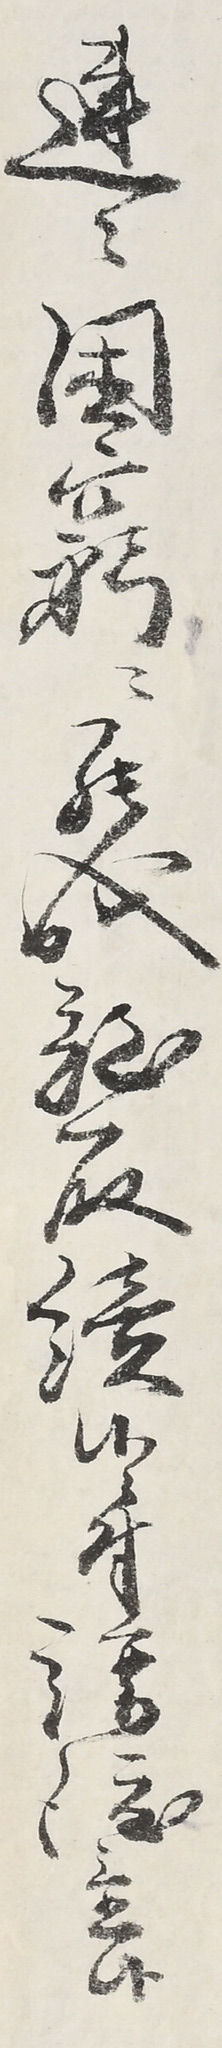連々困窮ニ罷成難取続候ニ付請渡置候
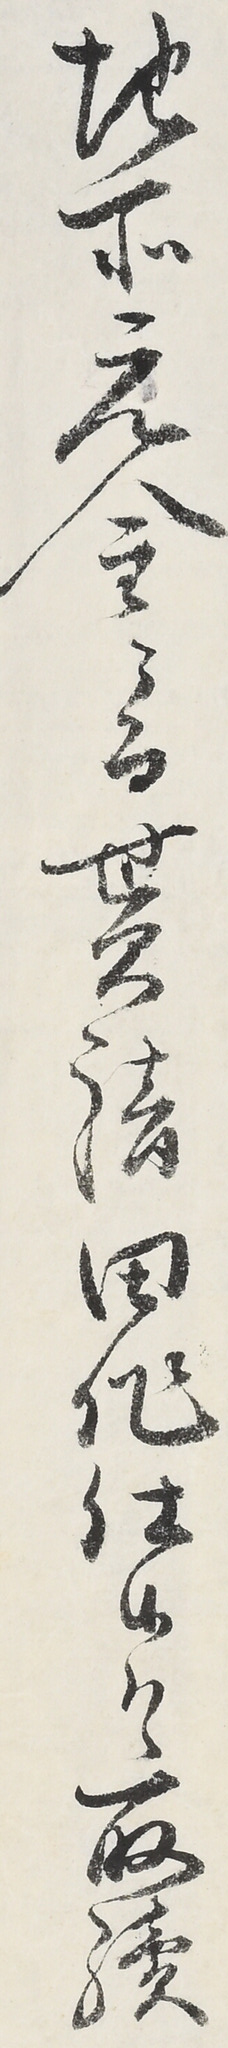地所元金ニ而貰請田作仕候ハゝ取続
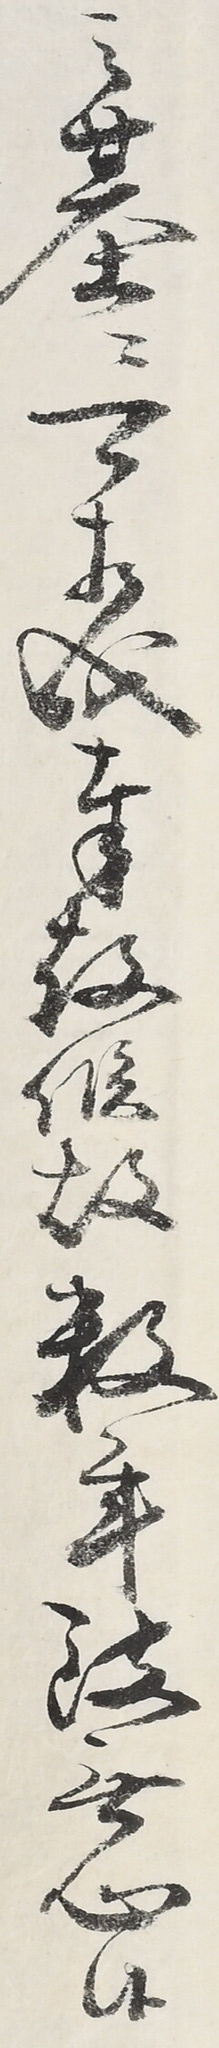之基ニ可相成奉存候故数年致無心候
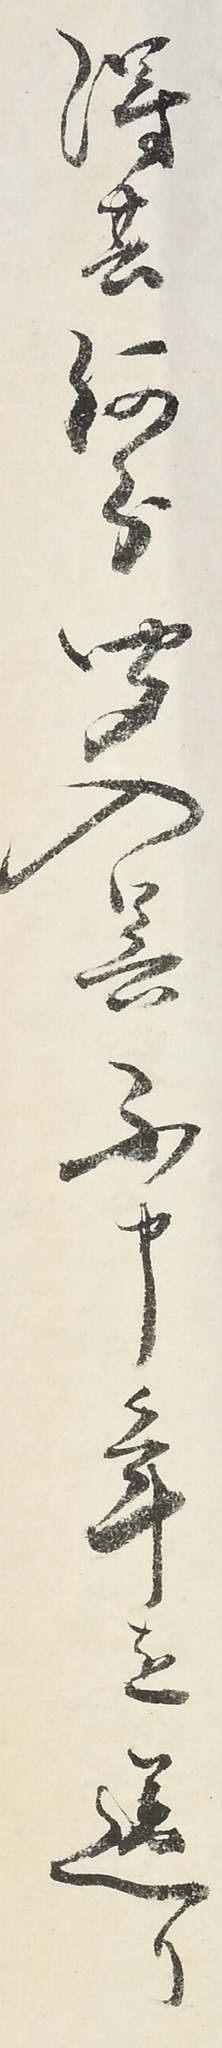得共何分聞入呉不申年を送り
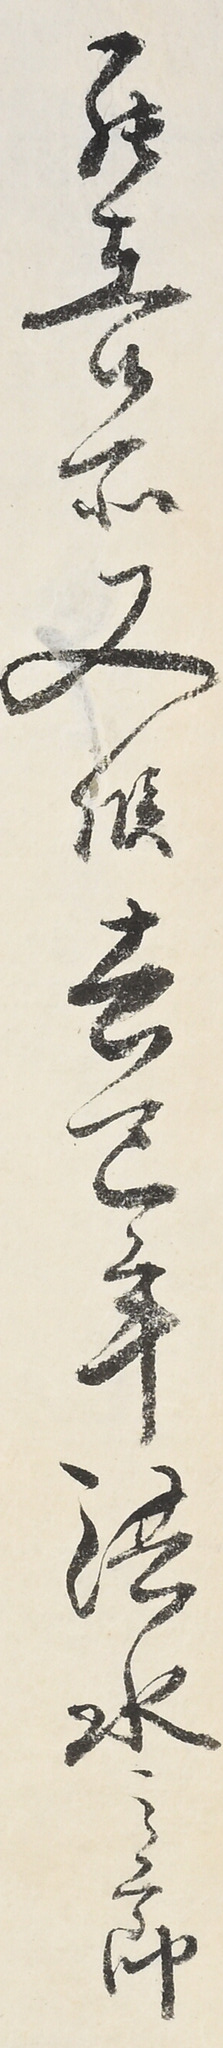罷在候所又候去巳年洪水之節
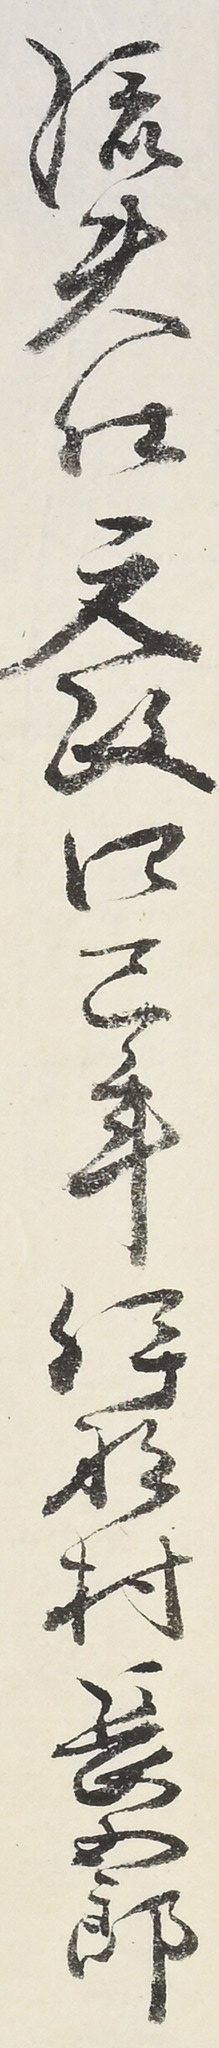流失仕文政四巳年伊那村長五郎
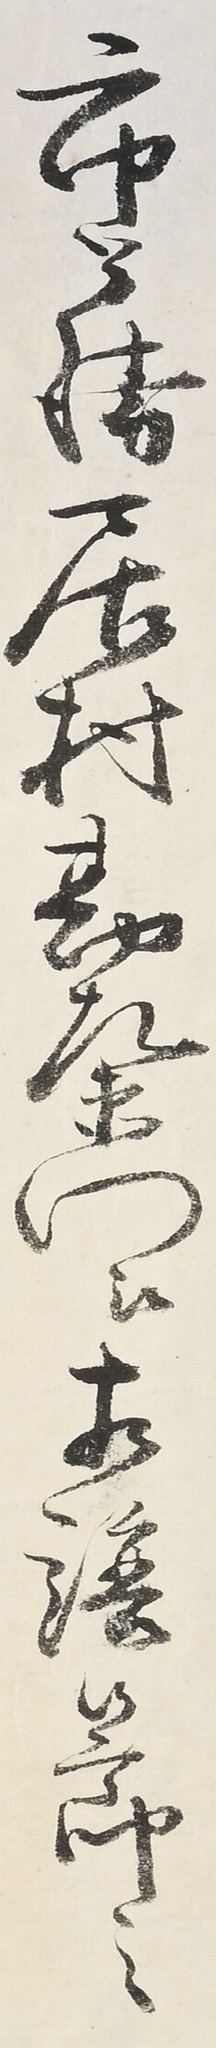市兵衛居村勘左衛門江相譲節之
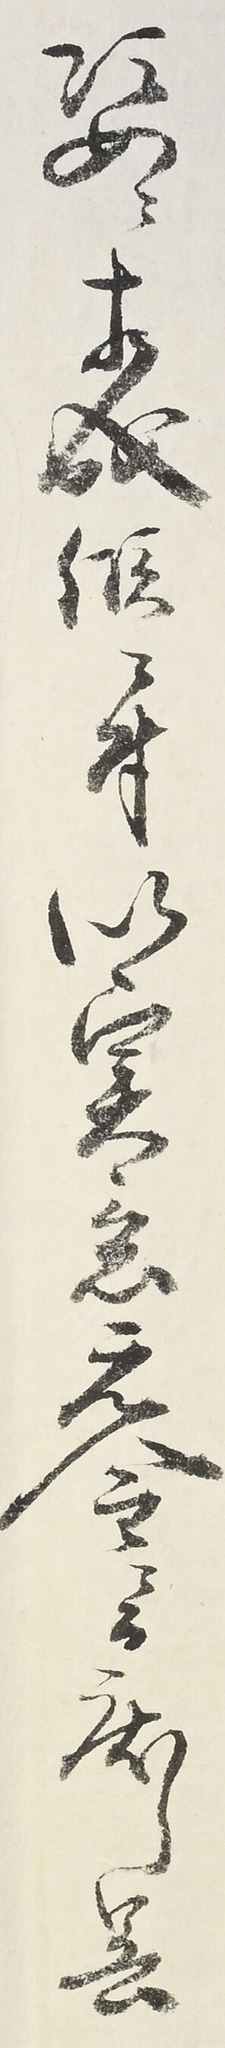姿ニ相成候ニ付以実意元金ニ而戻し呉
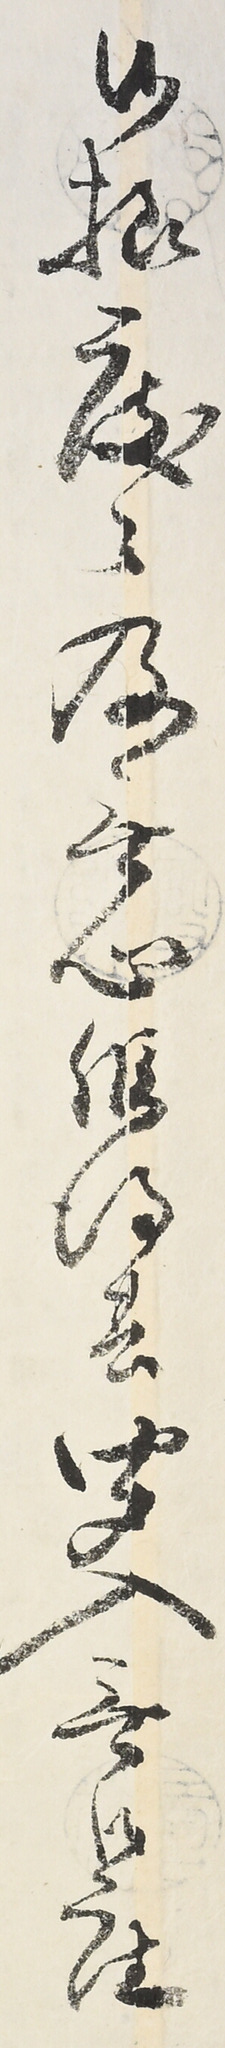候様度々及無心候得共聞入無御座
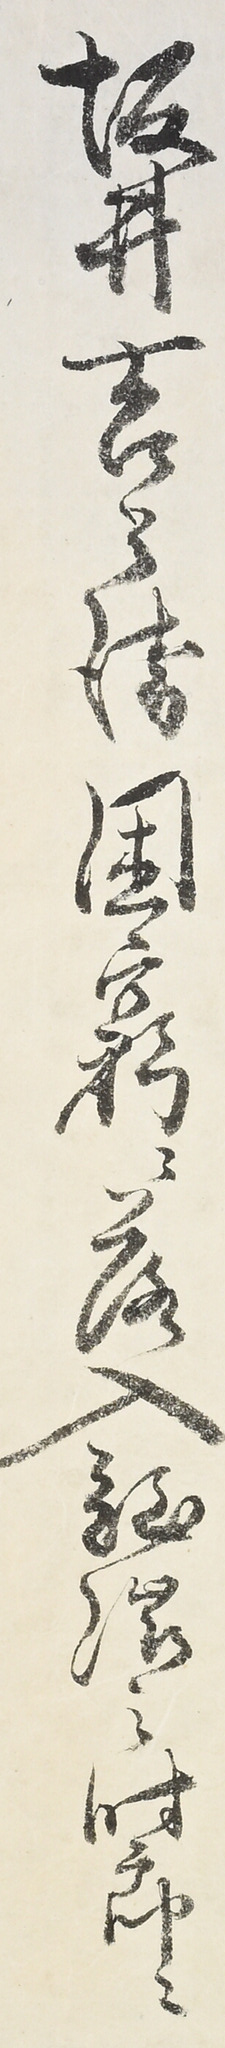坂井吉兵衛困窮ニ落入難渋之時節ニ
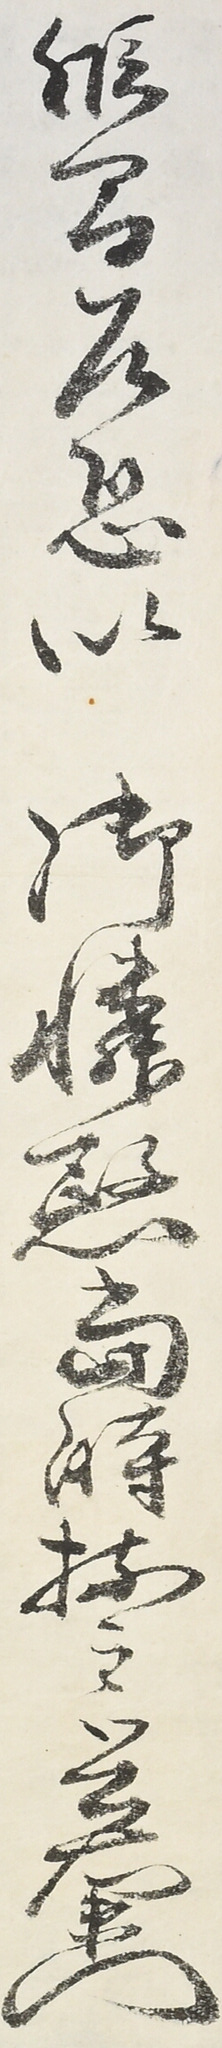候間乍恐以御憐愍当時持主兵右衛門
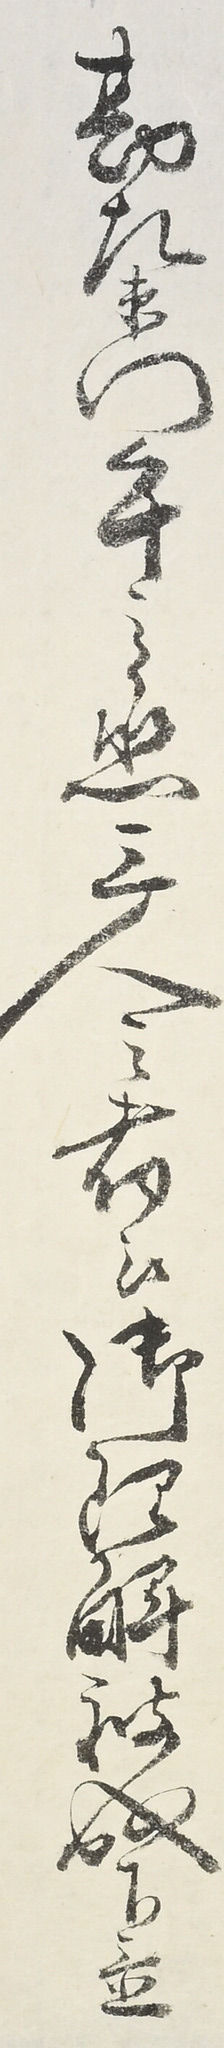勘左衛門午之烝三人之者江御理解被成下置
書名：差上申済口一札之事
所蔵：伊那市立高遠町図書館・合同会社AMANE
